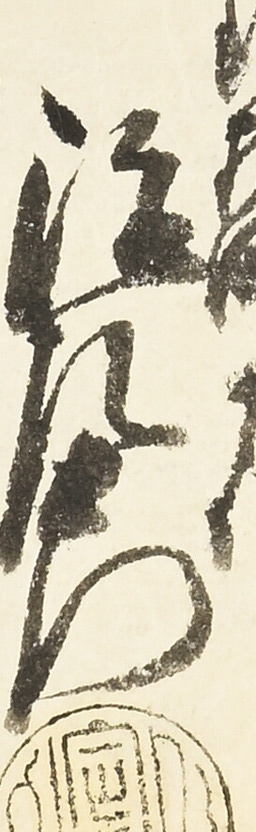巳治左衛門
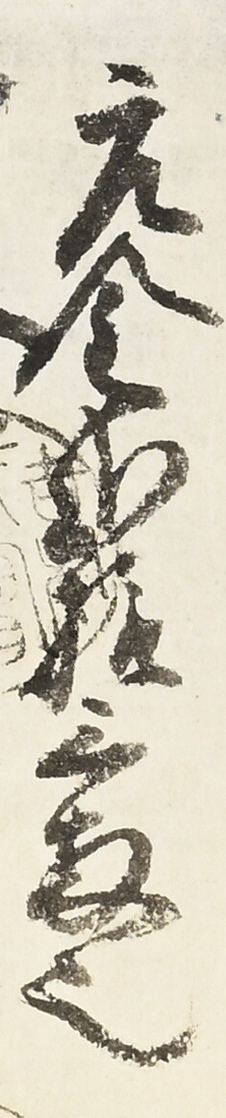元金弐拾三両也
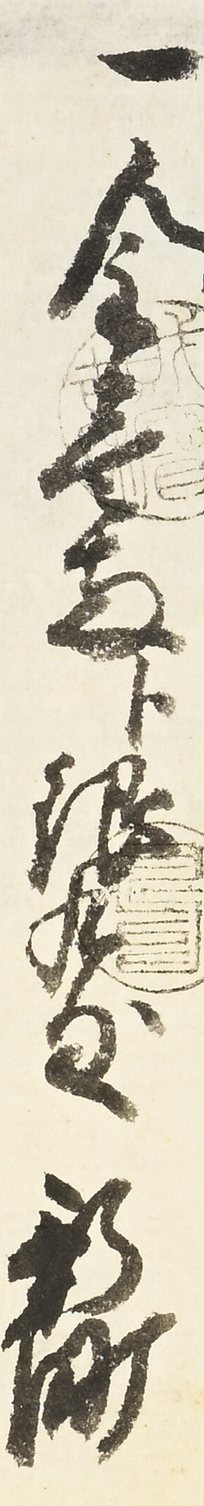一金壱両ト銀九匁新町
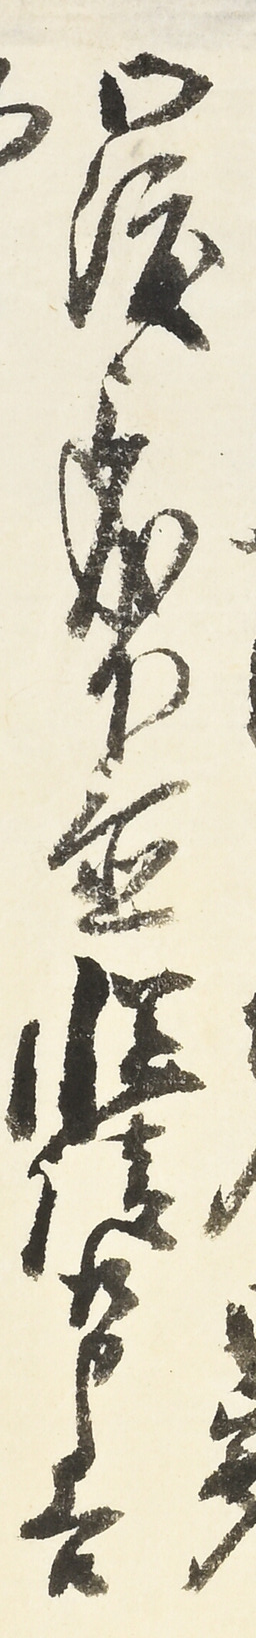御渡被成下置慥請取申上候
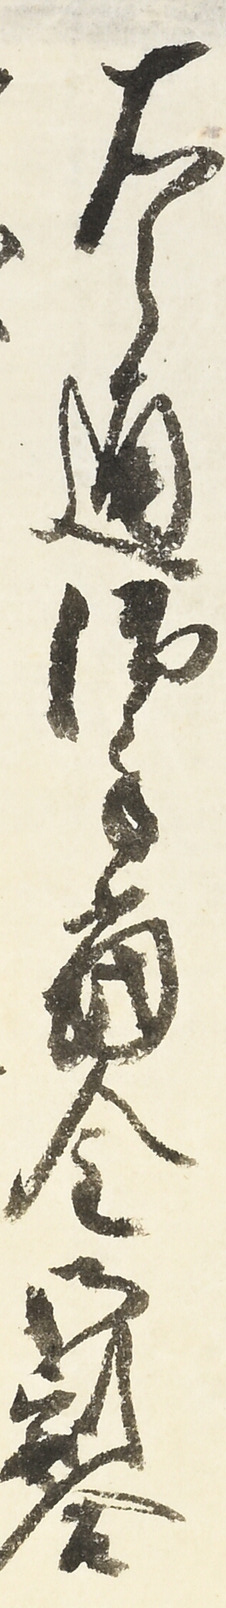右之通御手当金御割合
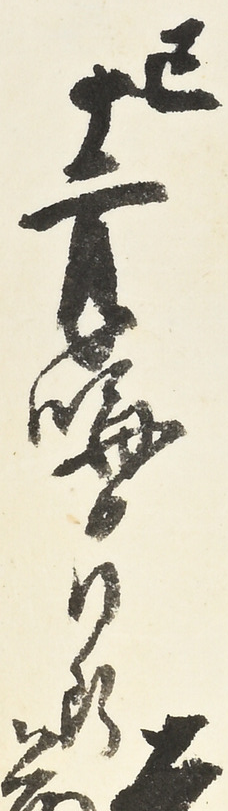十二月晦日同断
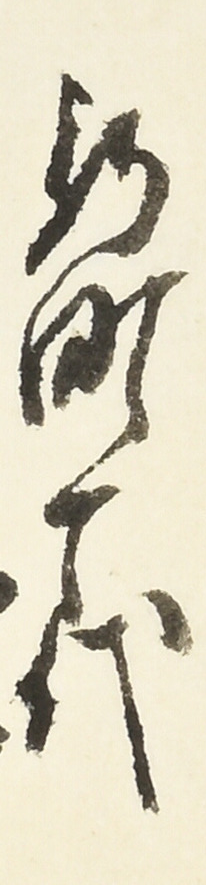新町丁代
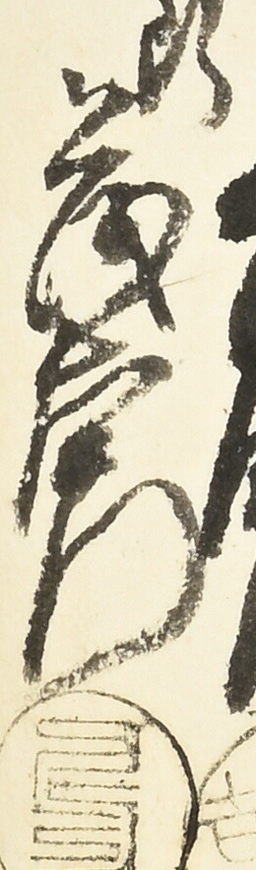茂右衛門
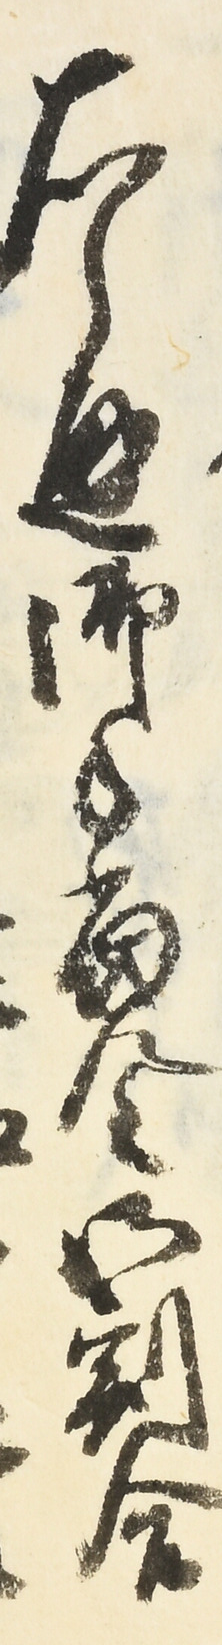右之通御手当金御割合
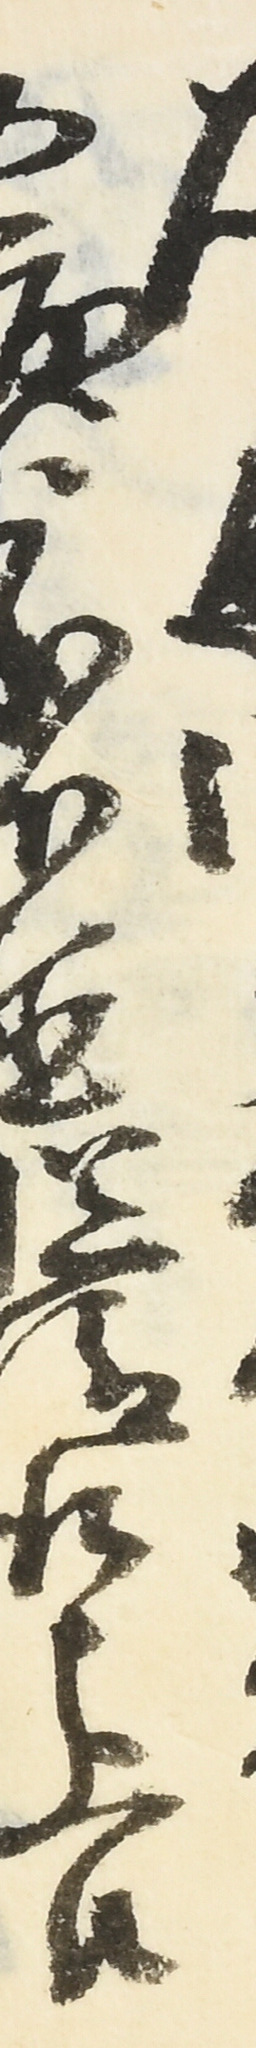御渡被成下置慥請取申上候

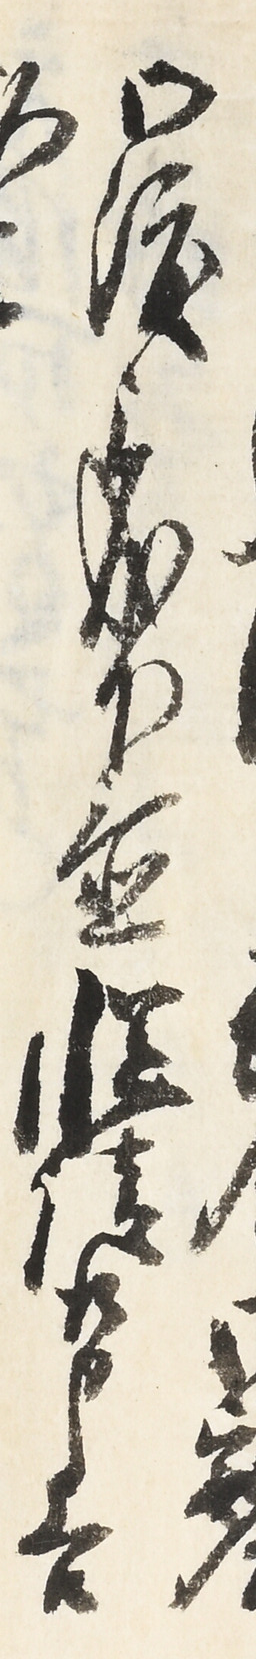御渡被成下置慥請取申上候
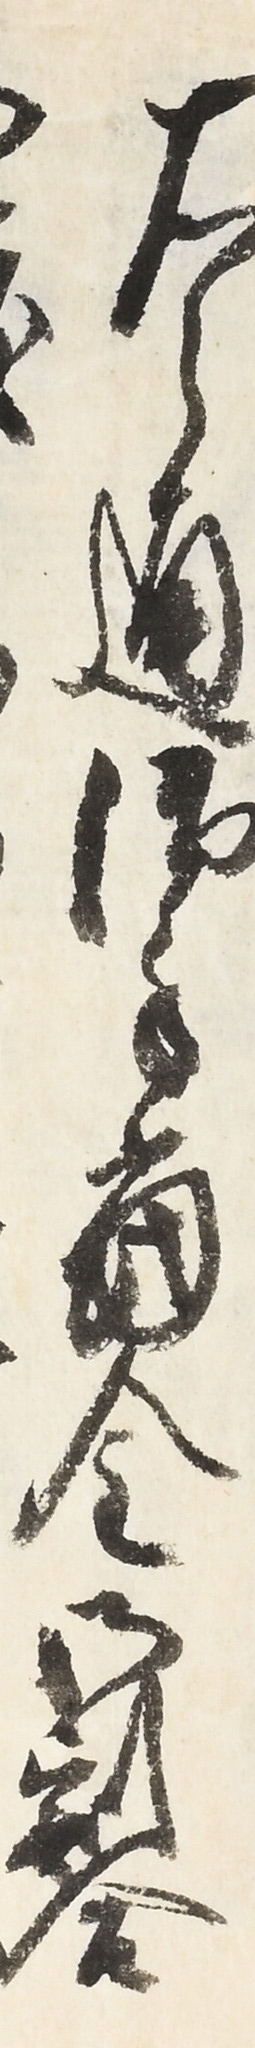右之通御手当金御割合
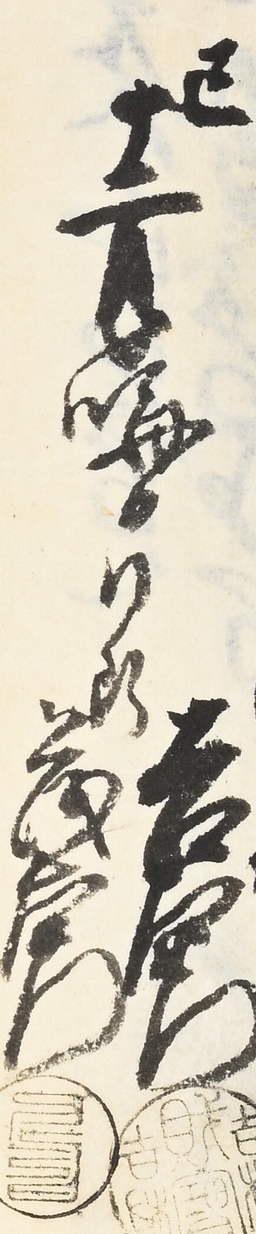十二月晦日同断
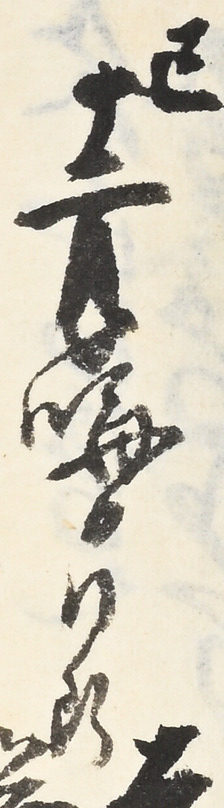十二月晦日同断
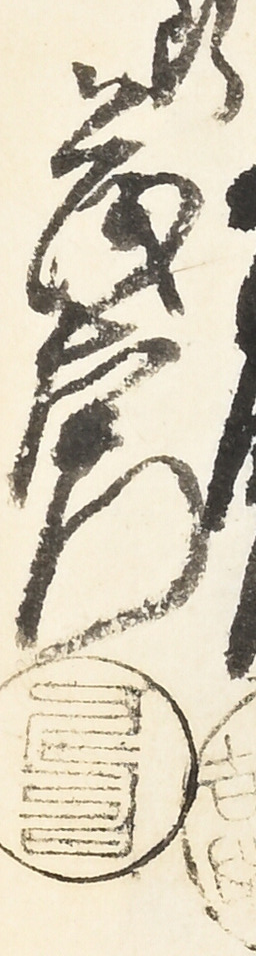伝右衛門
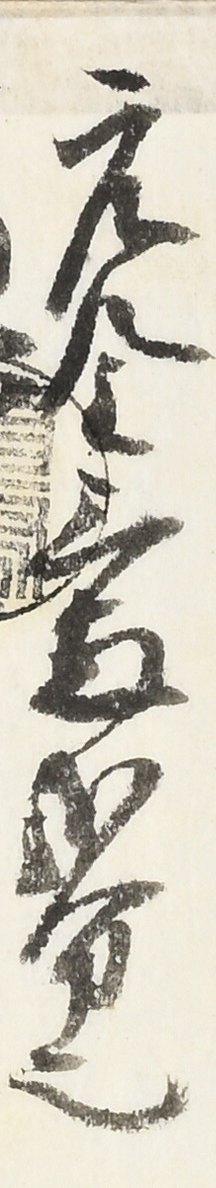元金三両弐分也
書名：御才覚金御利足割渡扣帳
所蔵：伊那市立高遠町図書館・合同会社AMANE
